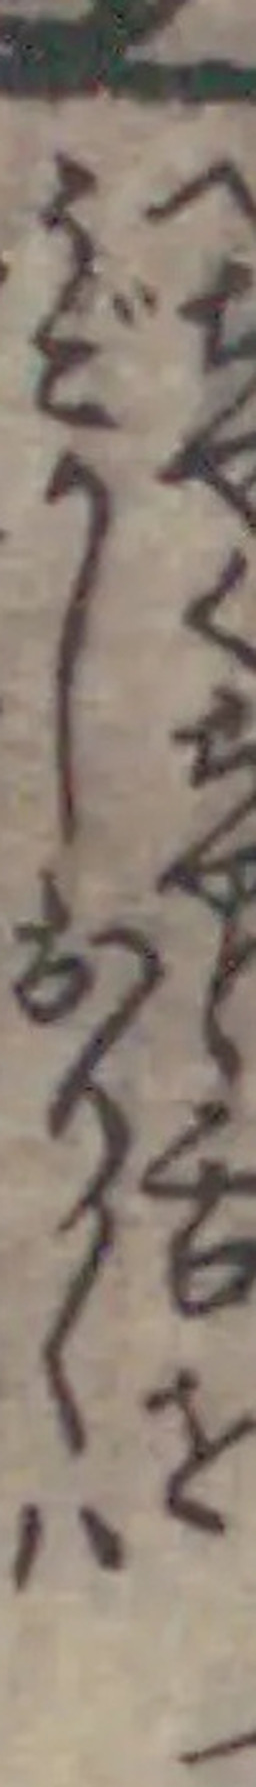うごかしおり〳〵は
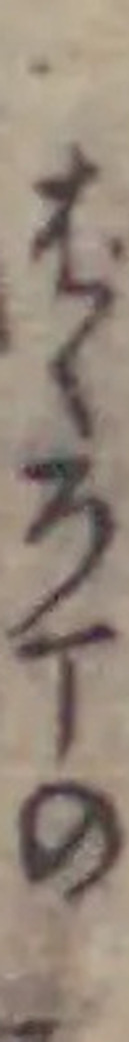ばくろ丁の
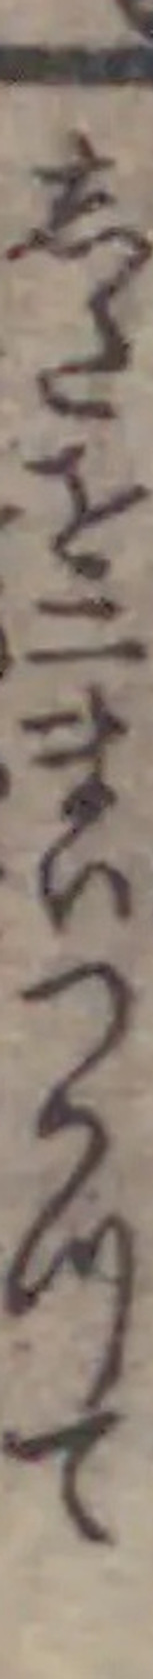したを二まいつかつて
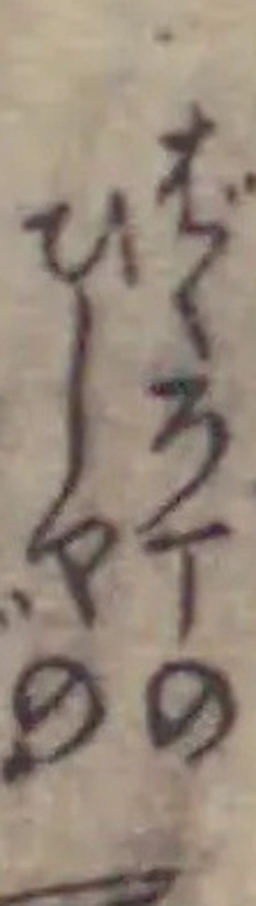ひしやの
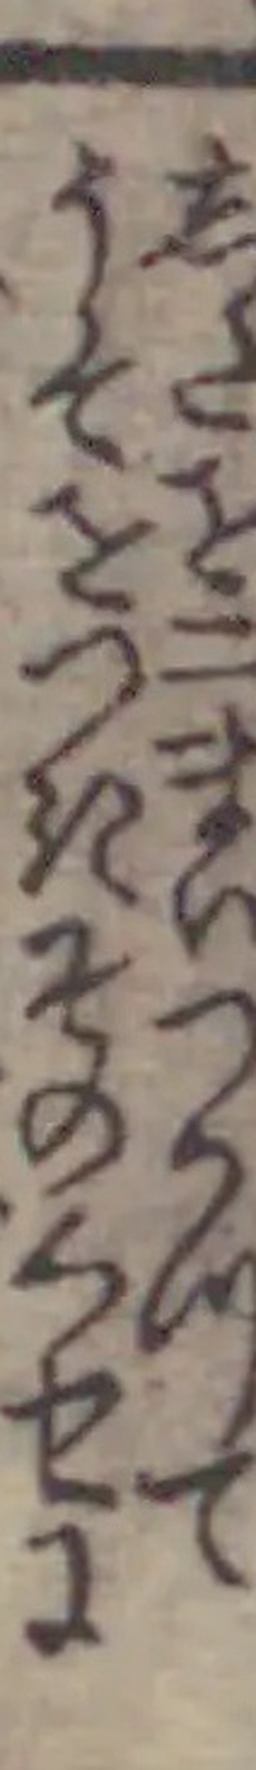うそをつきそのくせに
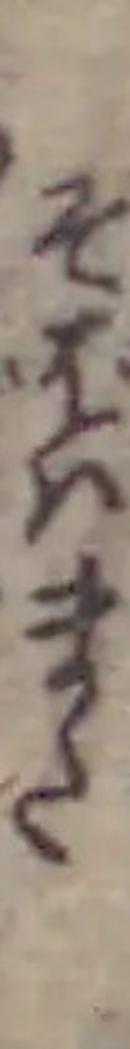そばはまた
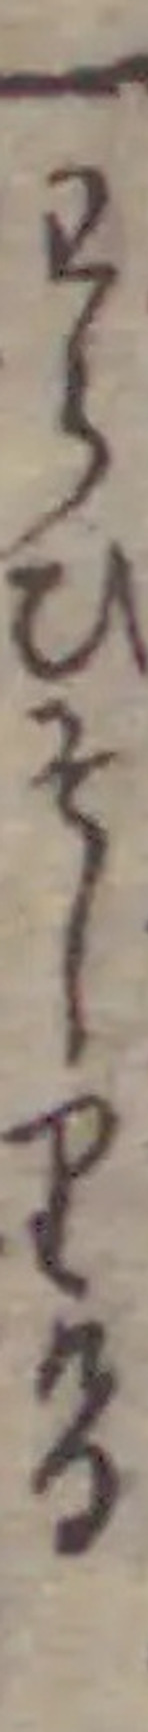わらひそしりける
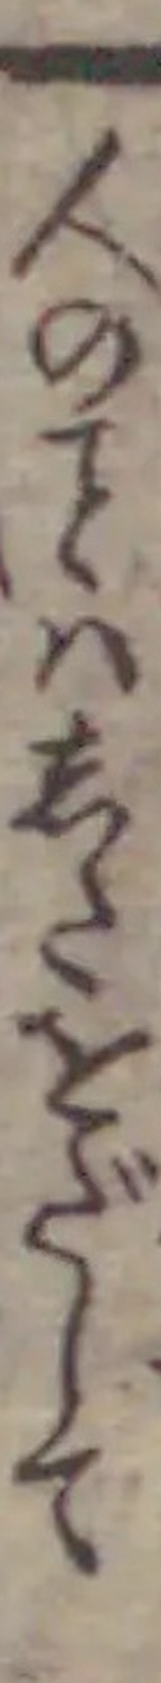人のことはしたをだして
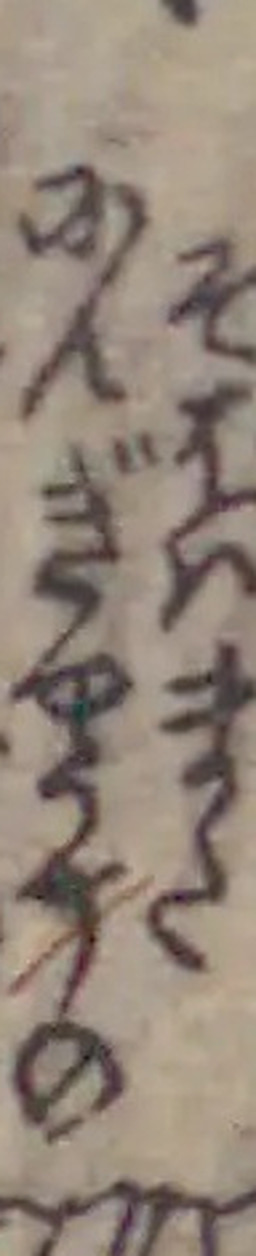にんぎやう丁の
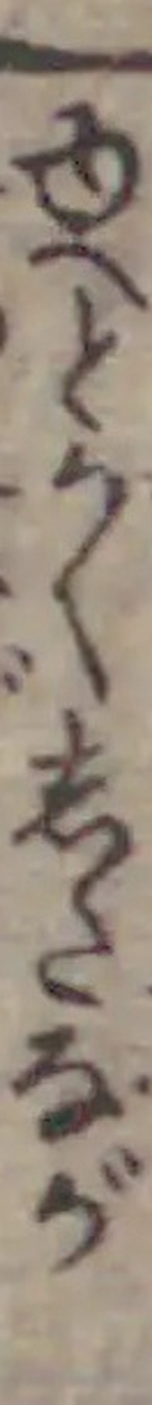ゆへとかくしたなが
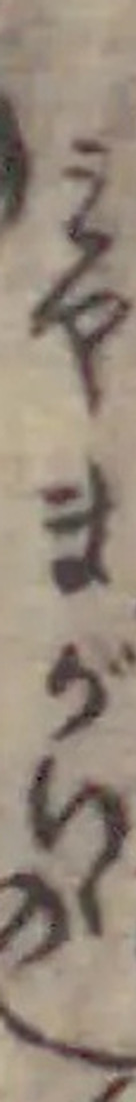みやまがいゝの
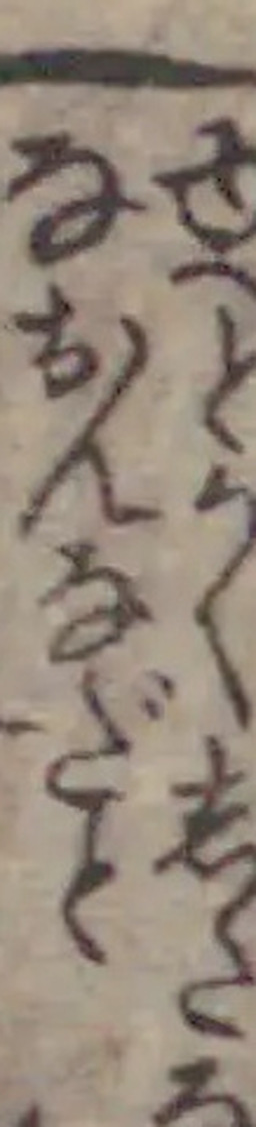なおんなだと
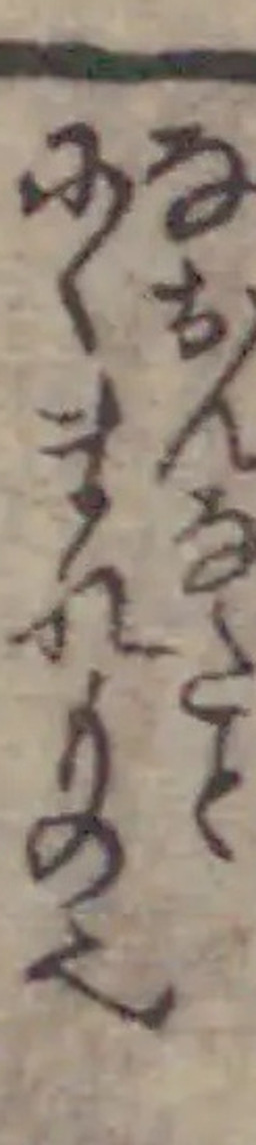にくまれもの也
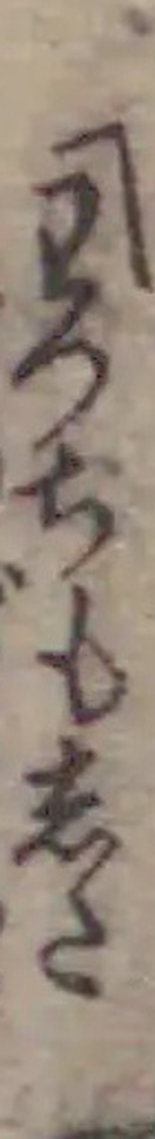〽わつちもした
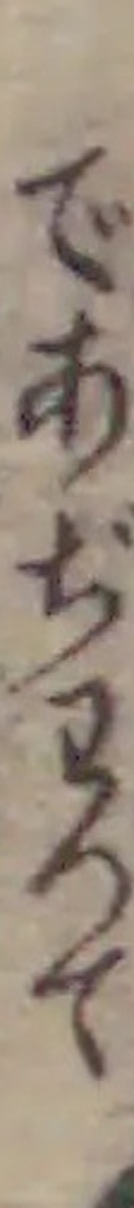であぢわつて
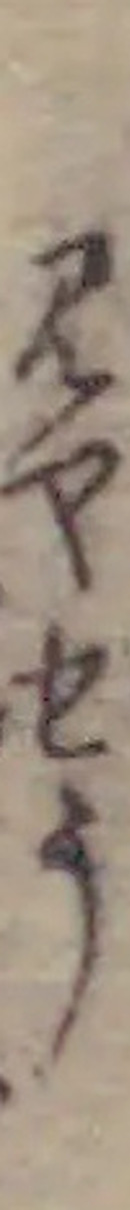見やせう
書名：腹内養生主論 3巻
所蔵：国立国会図書館 National Diet Library, JAPAN
